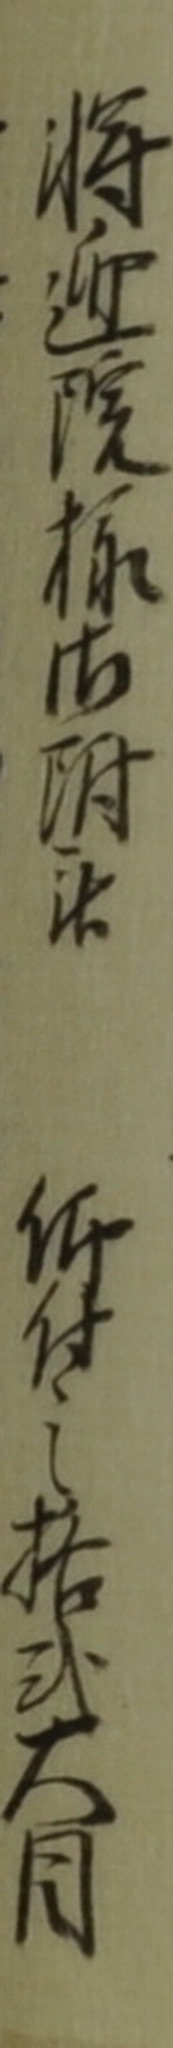将迎院様御附被仰付之格式大目
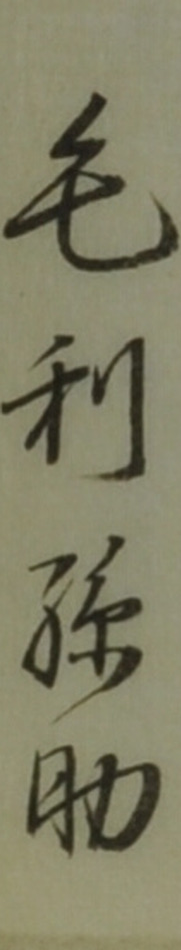毛利孫助
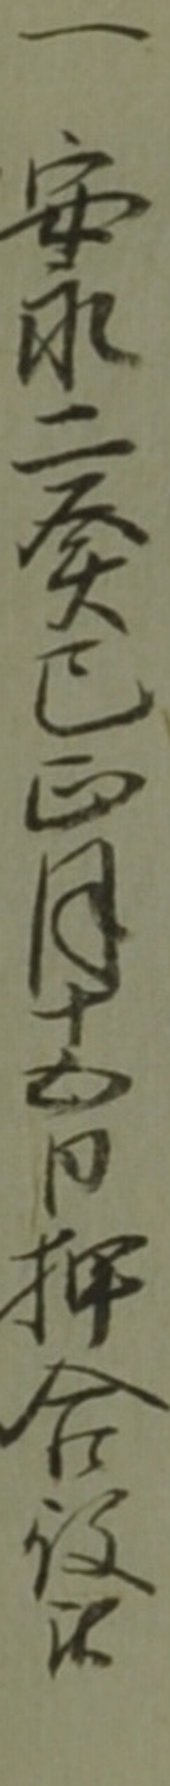一安永二癸巳正月十五日押合役被
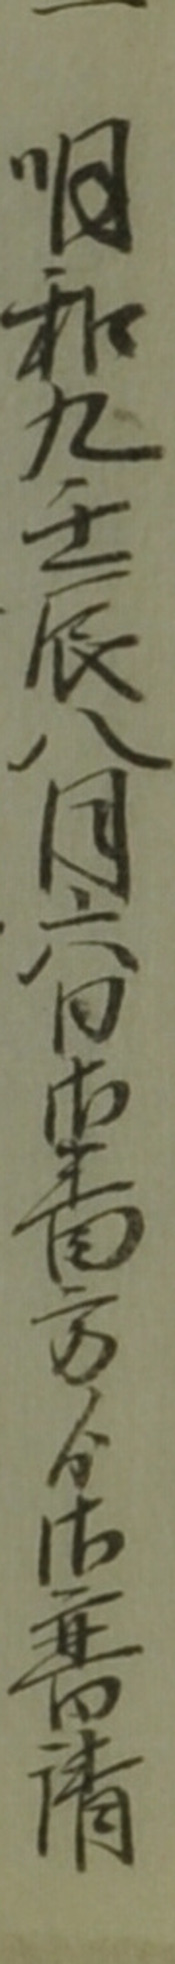一明和九壬辰八月六日御番方ゟ御普請
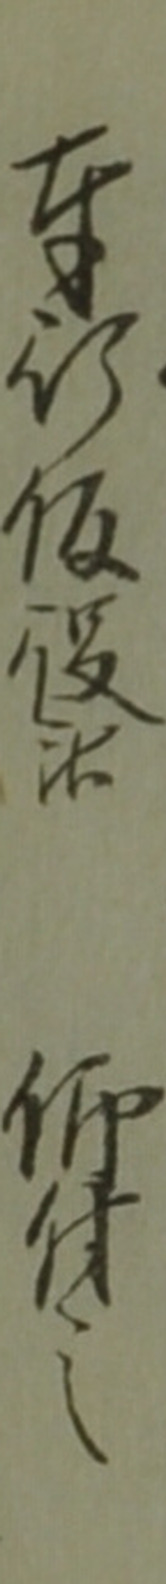奉行仮役被仰付之
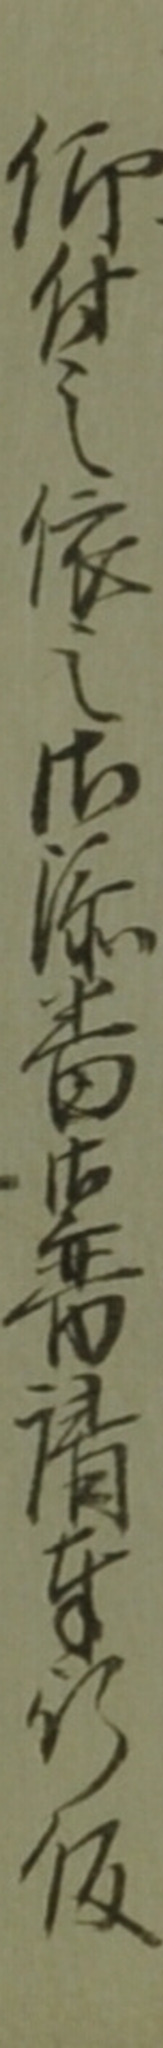仰付之依之御添番御普請奉行仮
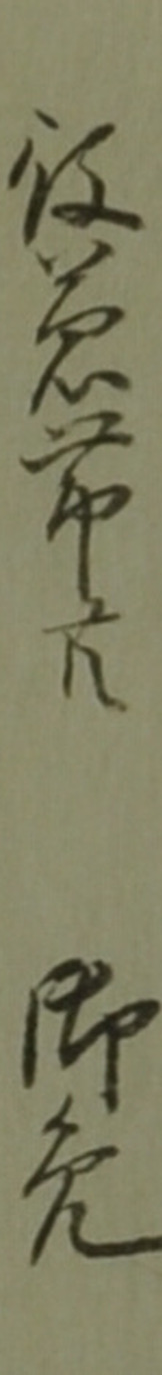役兼帯共御免
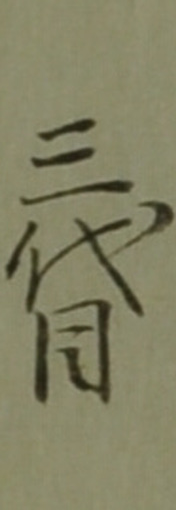三代目
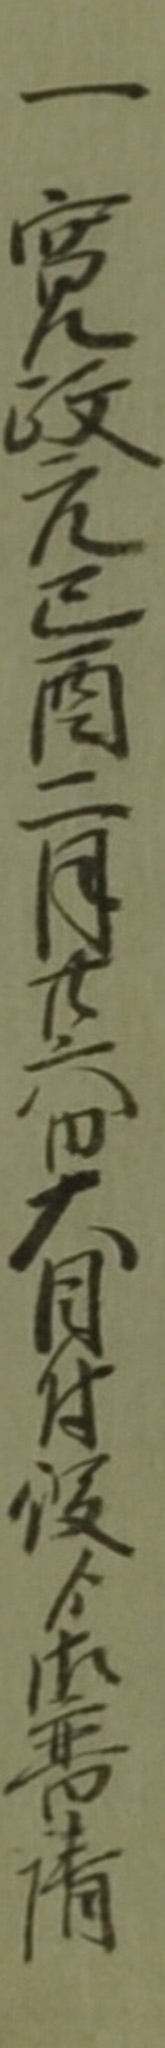一寛政元己酉二月廿六日大目付役ゟ御普請
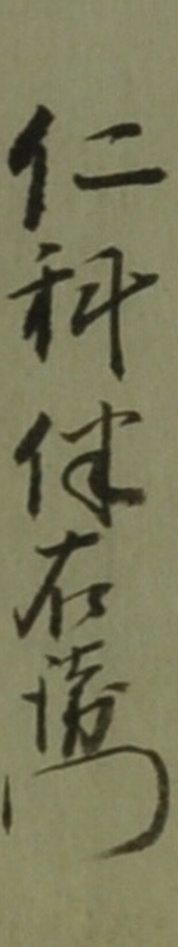仁科伴右衛門
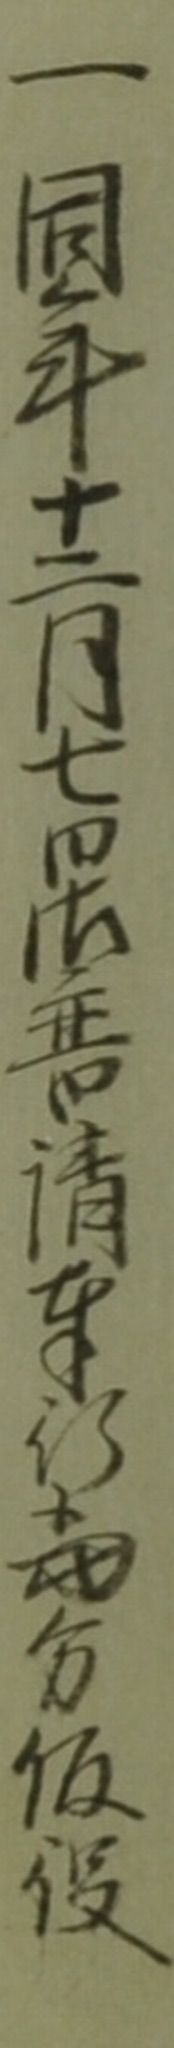一同年十二月七日御普請奉行当分仮役
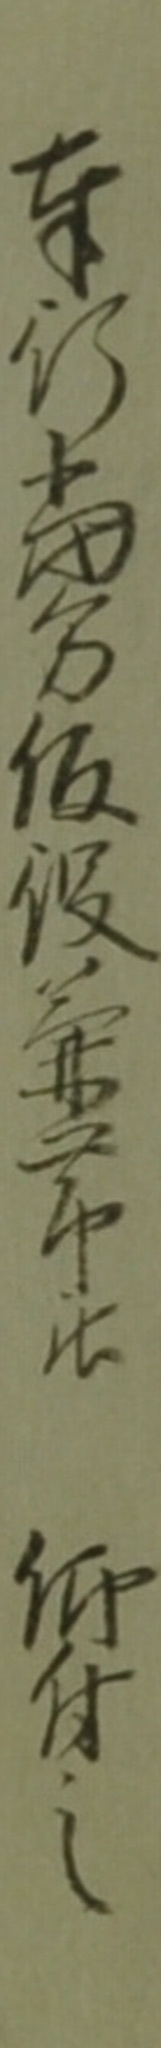奉行当分仮役兼帯被仰付之
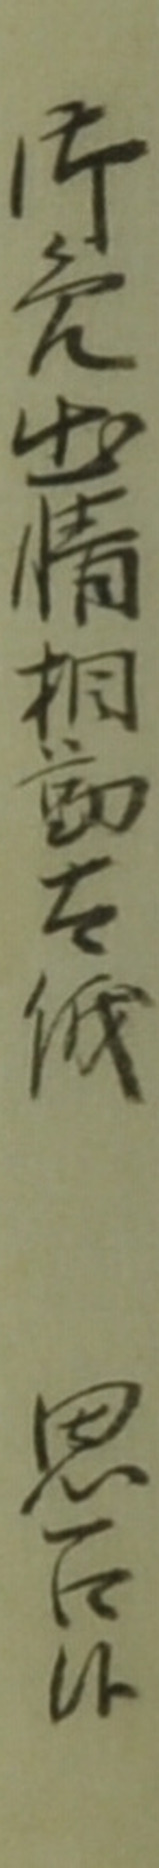御免出精相勤左儀思召候

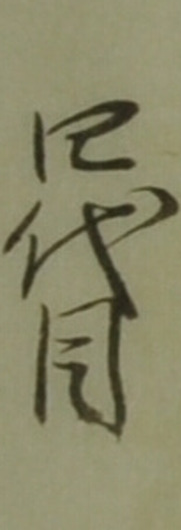四代目
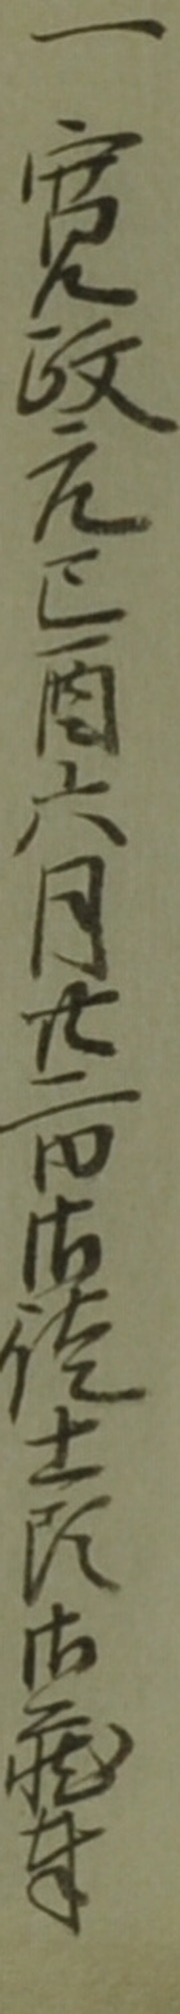一寛政元己酉六月廿二日御徒士頭御蔵奉
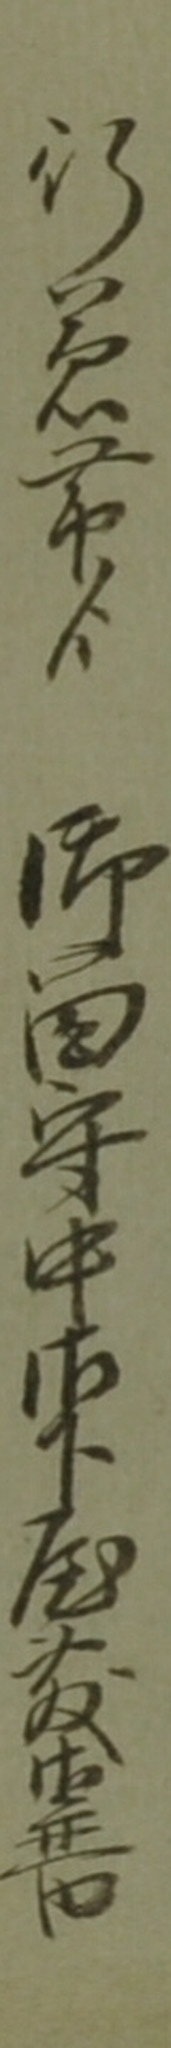行兼帯ゟ御留守中御下屋敷御普
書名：諸御役代々録（六）
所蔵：伊那市立高遠町図書館・合同会社AMANE
